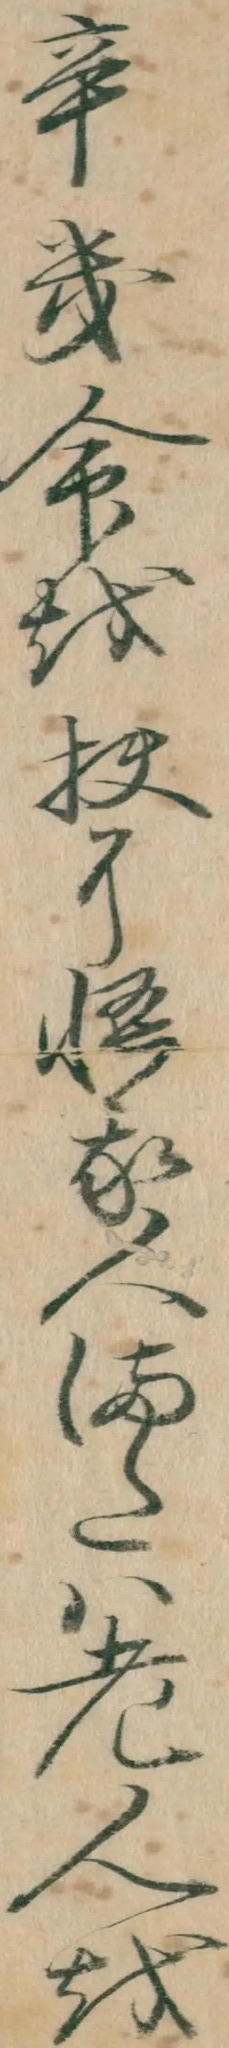辛き命を杖に怪我人または老人を
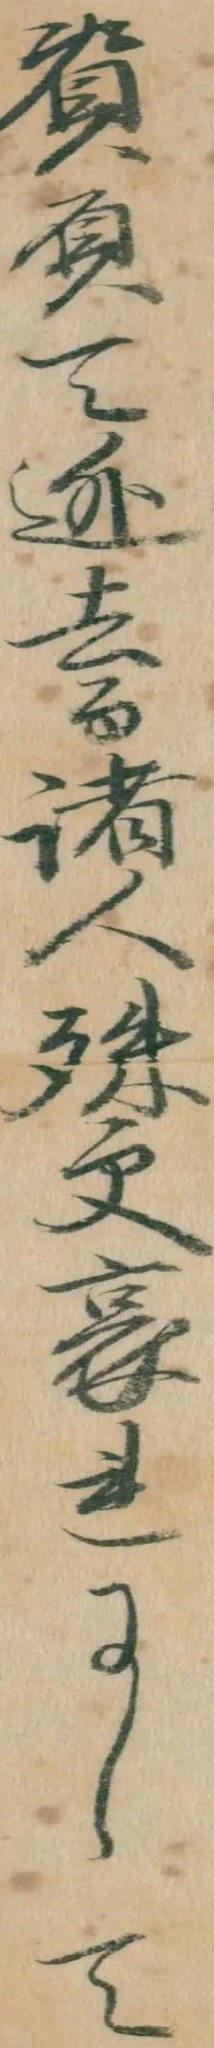背負て逃去る諸人殊更哀れにして
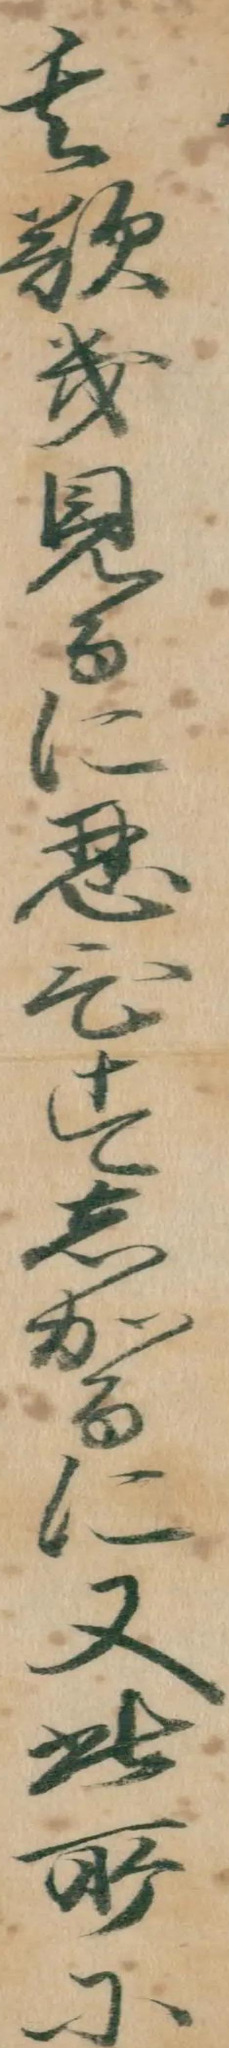其歎き見るに忍ひすしかるに又此所に
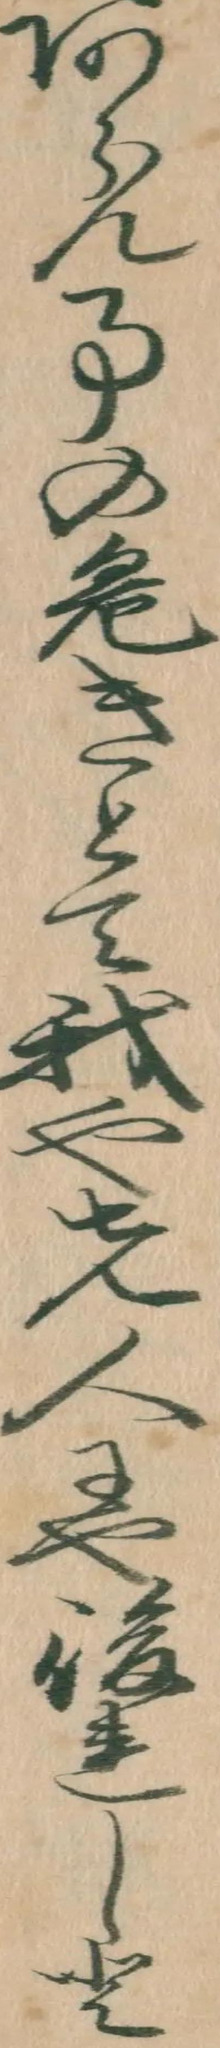あらん事の危きとて我や先人にや後れしと
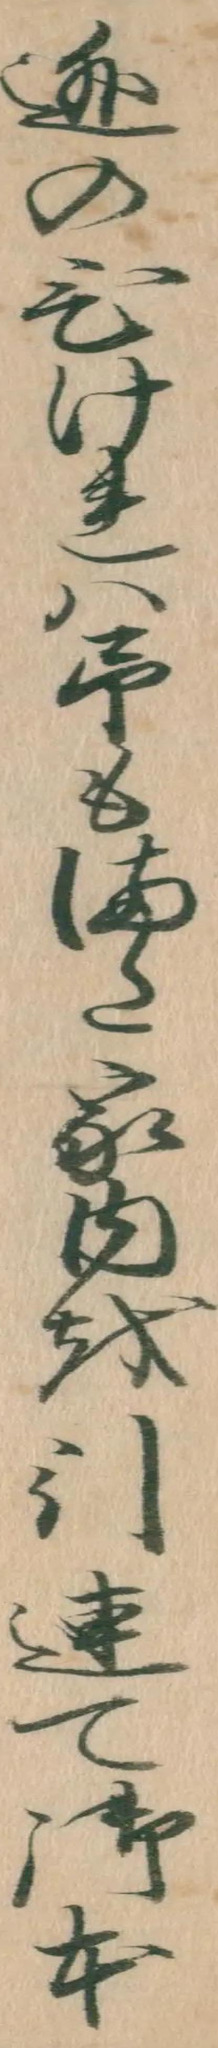逃のひけれは予もまた家内を引連て御本
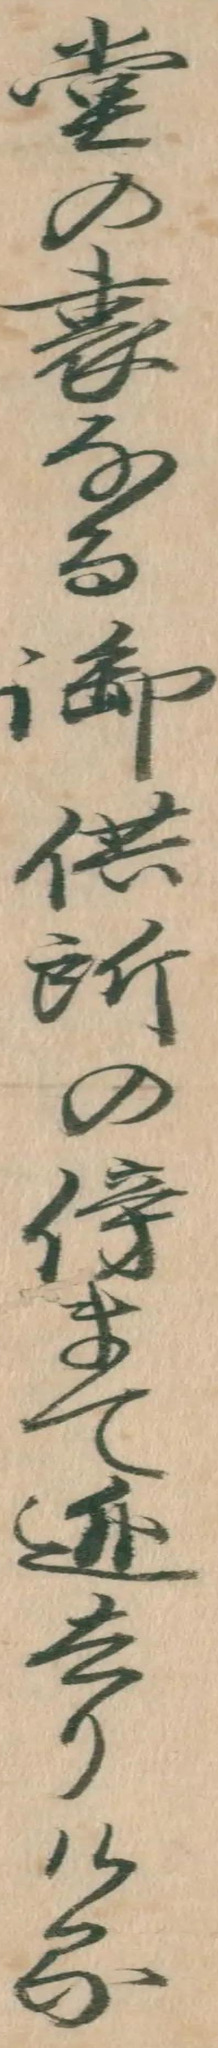堂の裏なる御供所の傍まて逃去りける
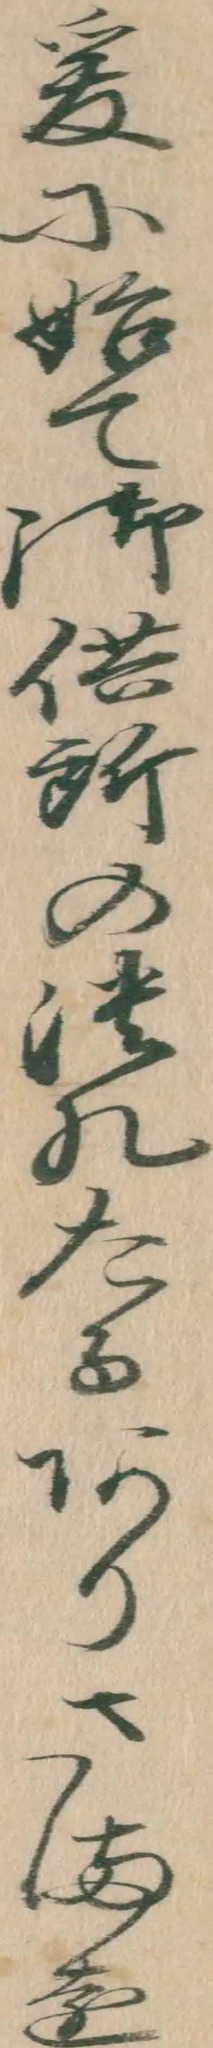爰に始て御供所の潰れたるありさまを
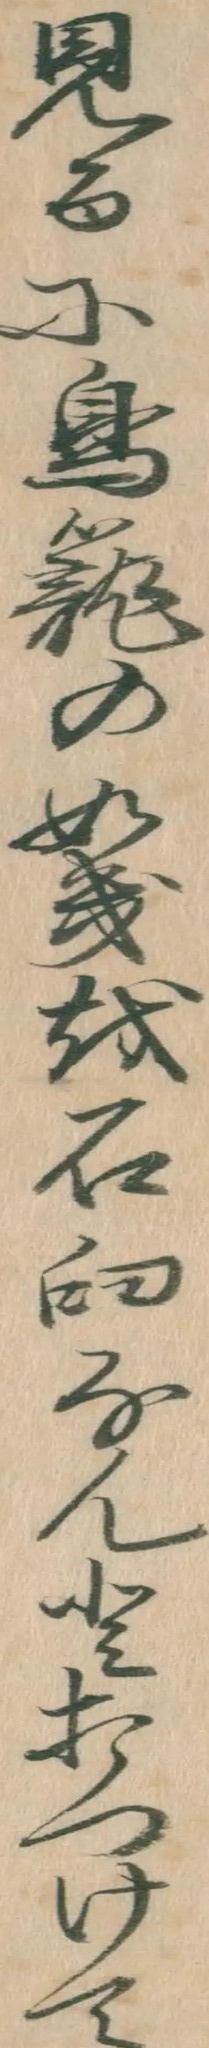見るに鳥籠の如きを石臼なんと打つけて
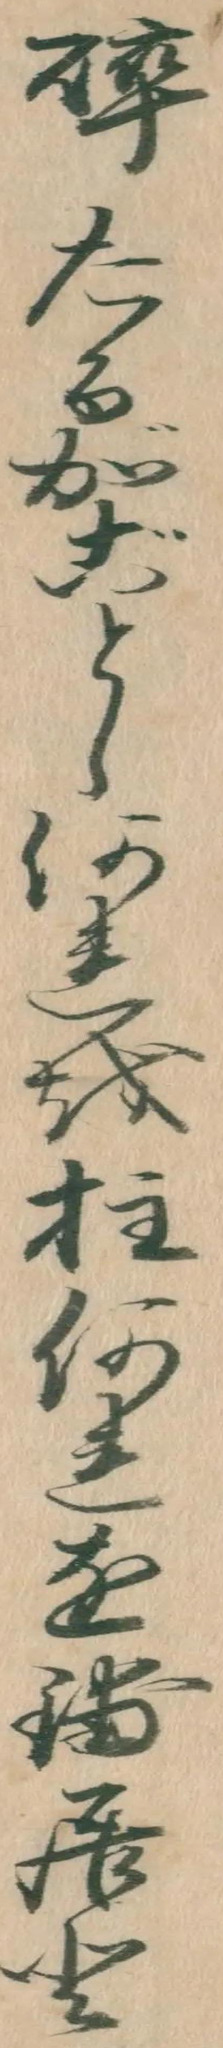砕たるがごとく何れを柱何れを鋪居と
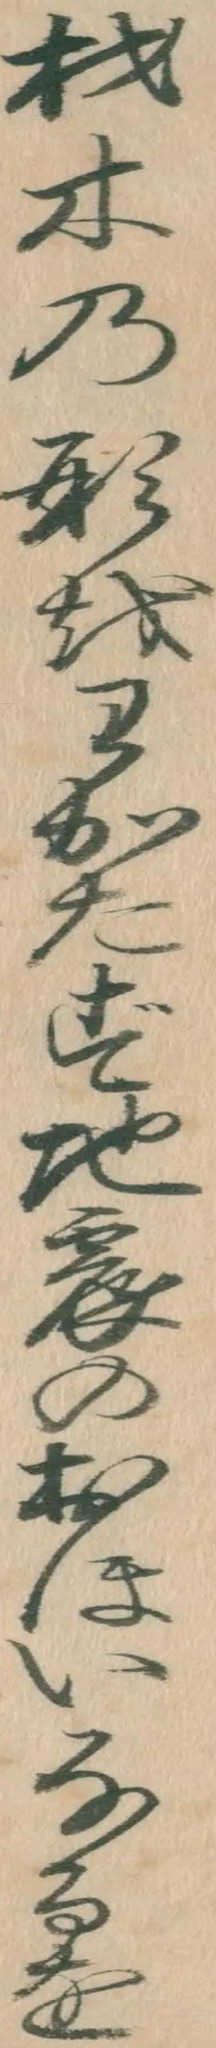材木の形をわかたず地震のおほいなるを
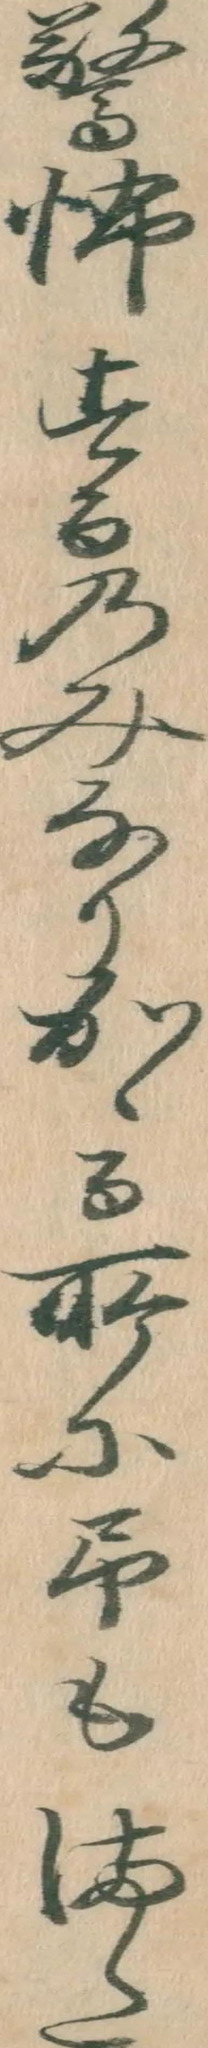驚怖するのみなりかゝる所に予もまた
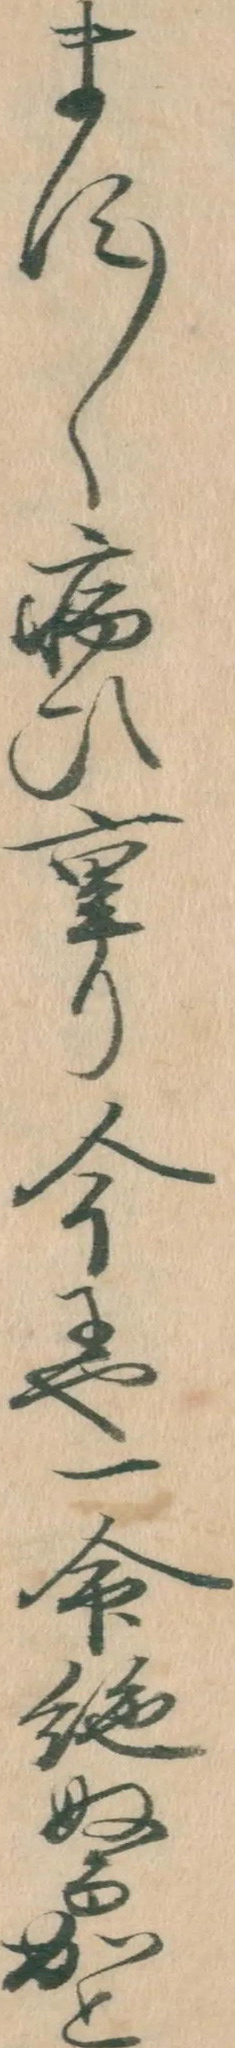ます〳〵病ひ重り今にや一命絶ぬるかと
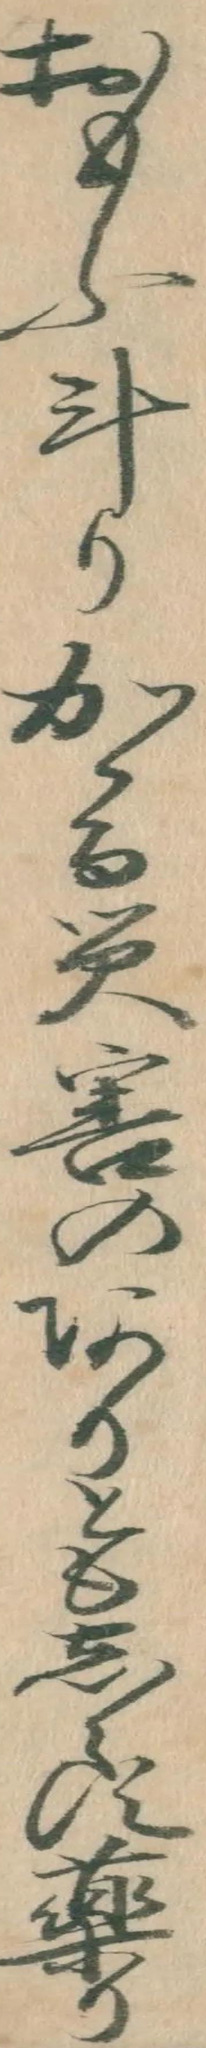おもふ斗りかゝる災害のありともしらす薬り

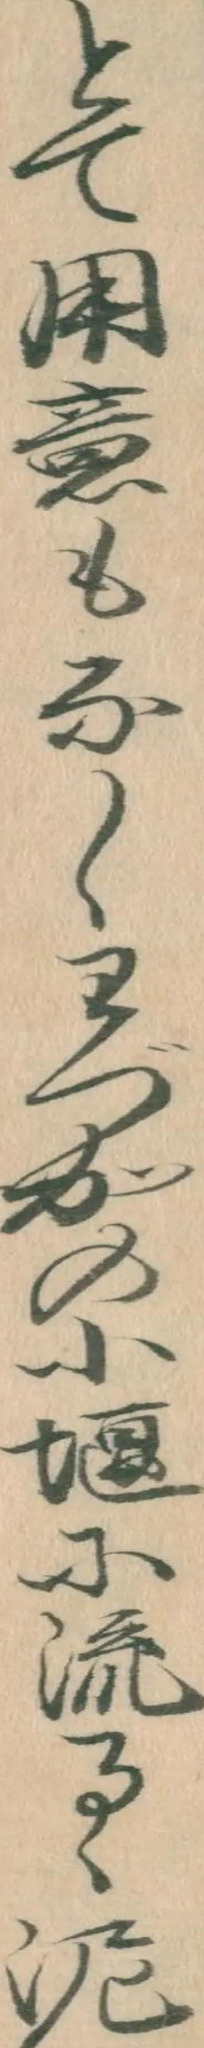とて用意もなくわづかの小堰に流るる泥
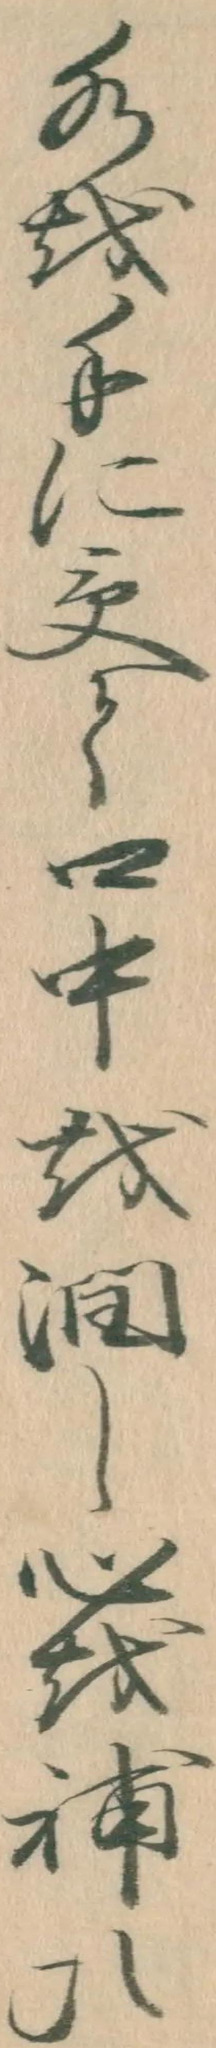水を手に受て口中を潤し心を補ひ
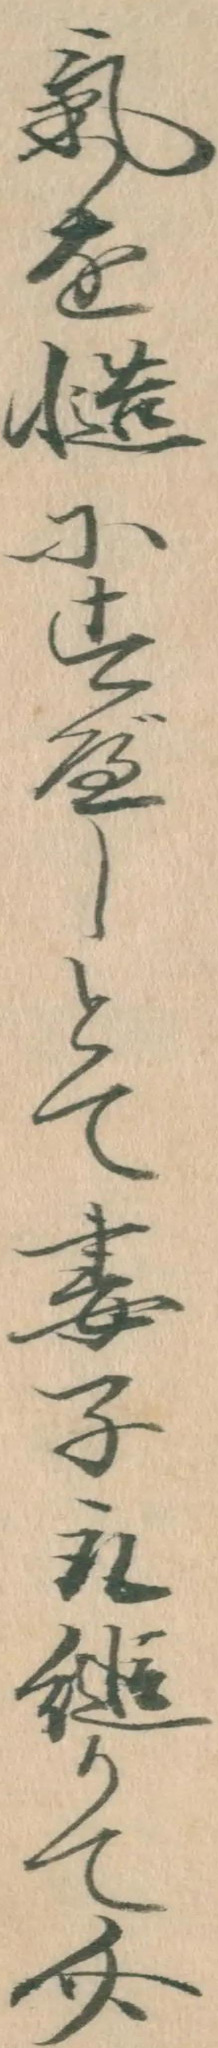気を慥にすべしとて妻子取縋りて介
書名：俗語之種. [3]
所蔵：国立国会図書館 National Diet Library, JAPAN
